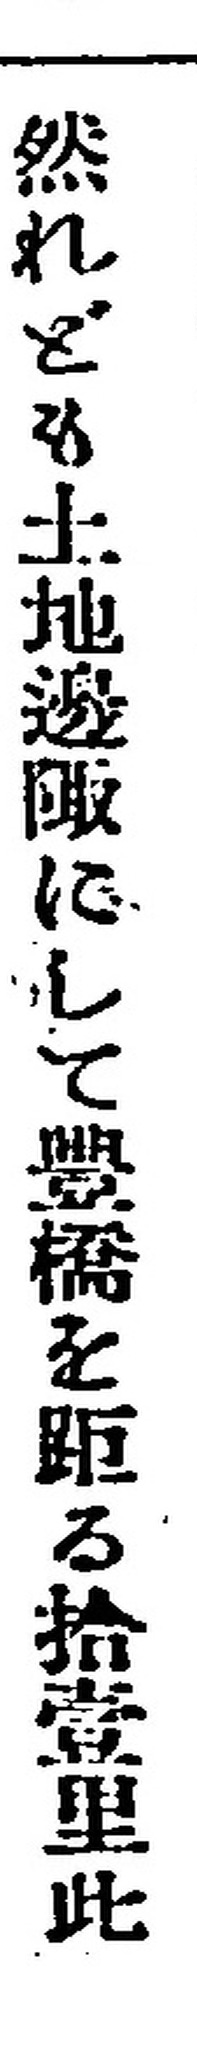然れども土地辺陬にして豊橋を距る拾壱里此
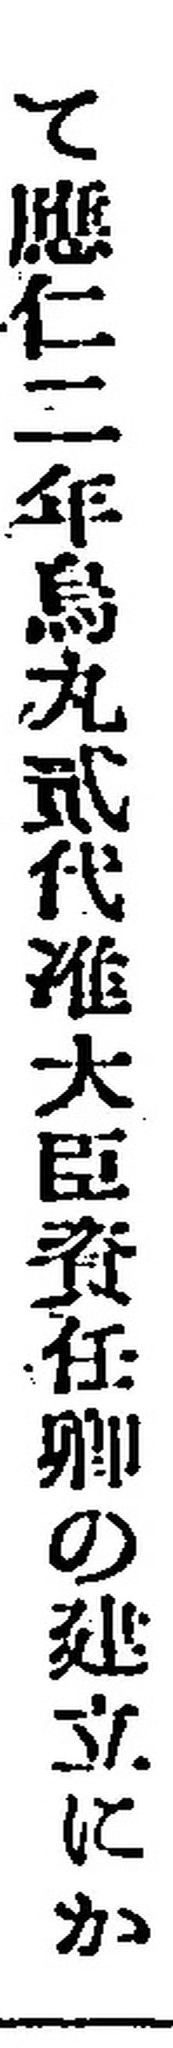て応仁二年烏丸弐代准大臣資任卿の建立にか
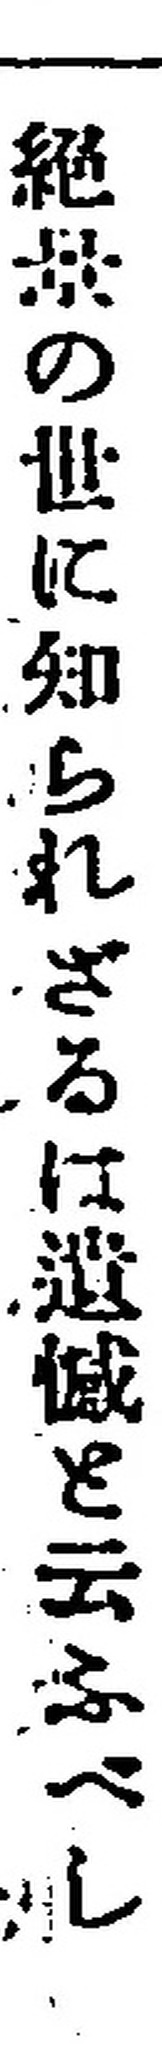絶景の世に知られざるは遺憾と云ふべし
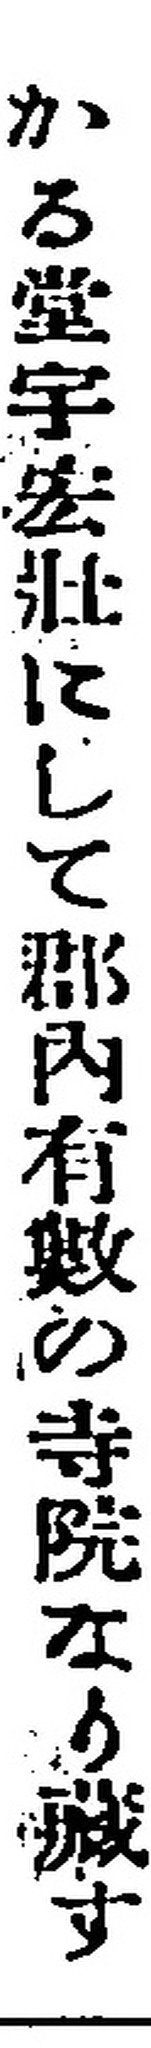かる堂宇宏壮にして郡内有数の寺院なり蔵す
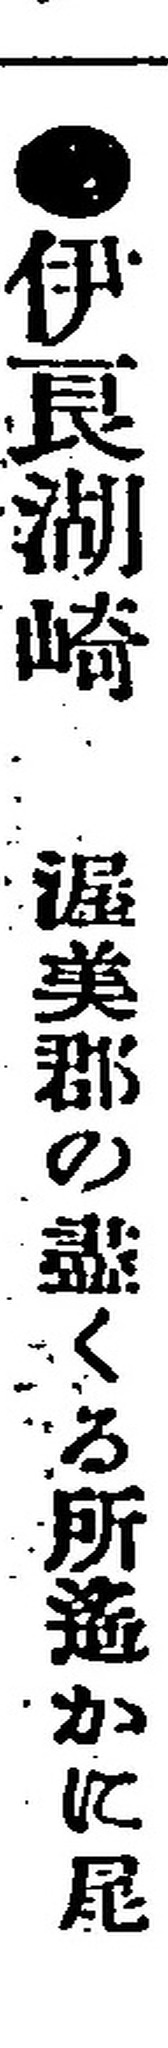●伊良湖崎渥美郡の尽くる所遥かに尾
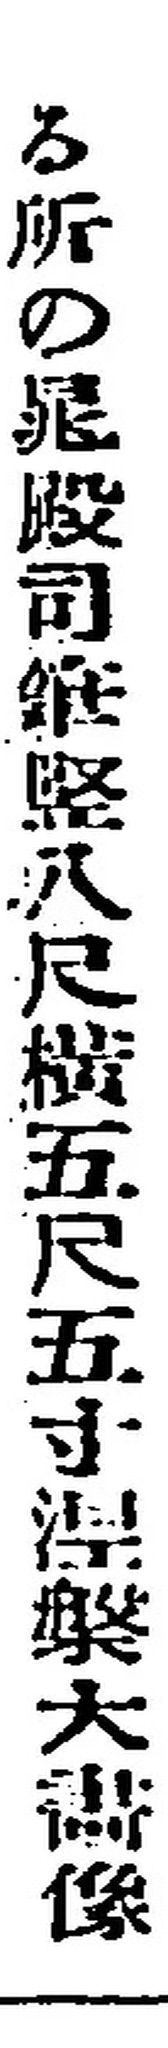る所の晁殿司筆竪八尺横五尺五寸涅槃大画像
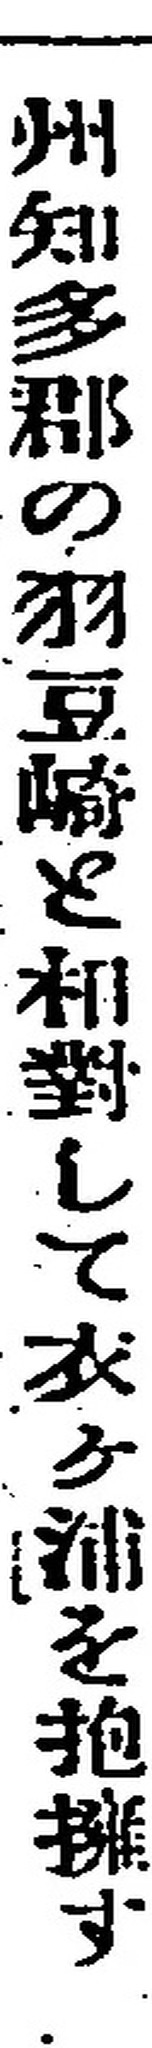州知多郡の羽豆崎と相対して衣ヶ浦を抱擁す
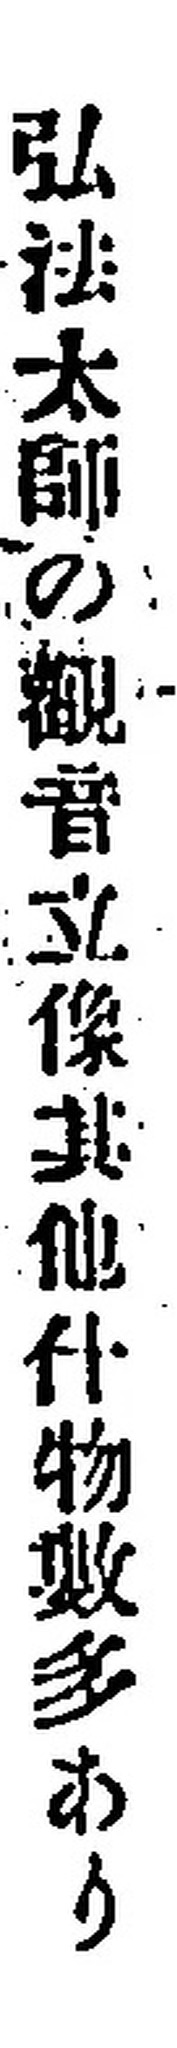弘法太師の観音立像其他什物数多あり
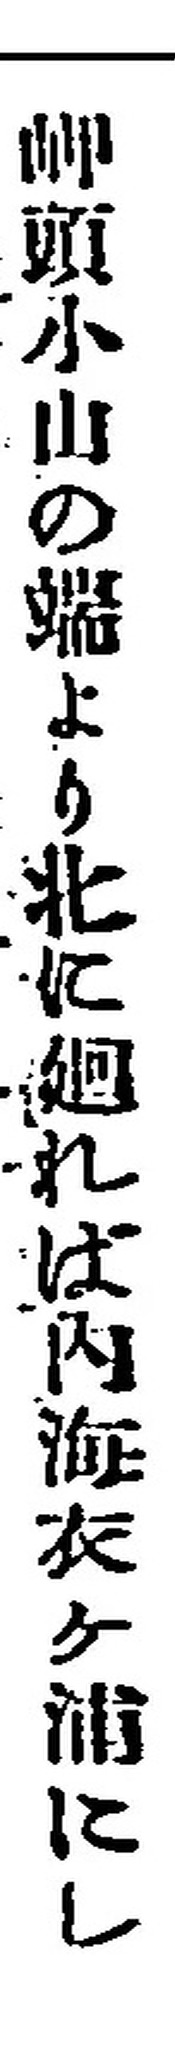岬頭小山の端より北に廻れば内海衣ヶ浦にし
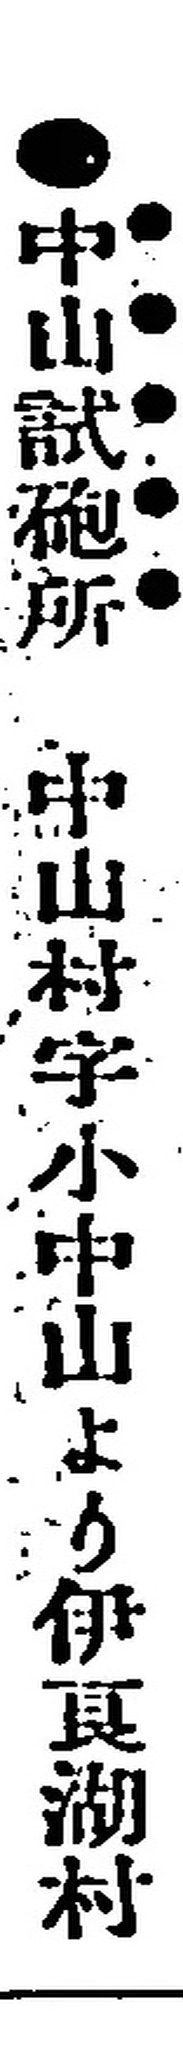●中山試砲所中山村字小中山より伊良湖村
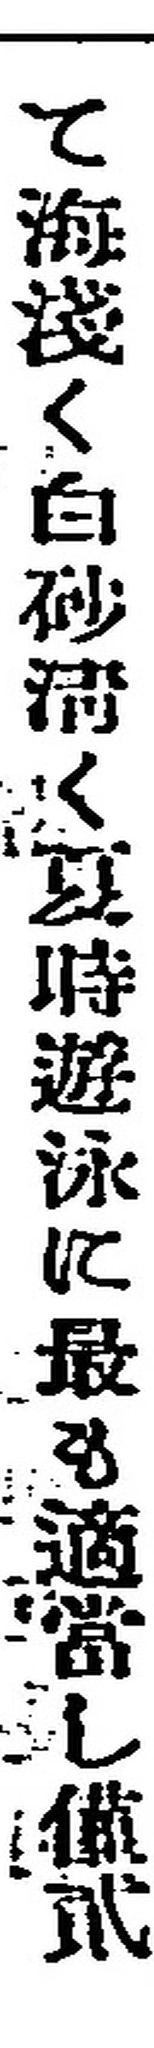て海浅く白砂清く夏時遊泳に最も適当し僅弐
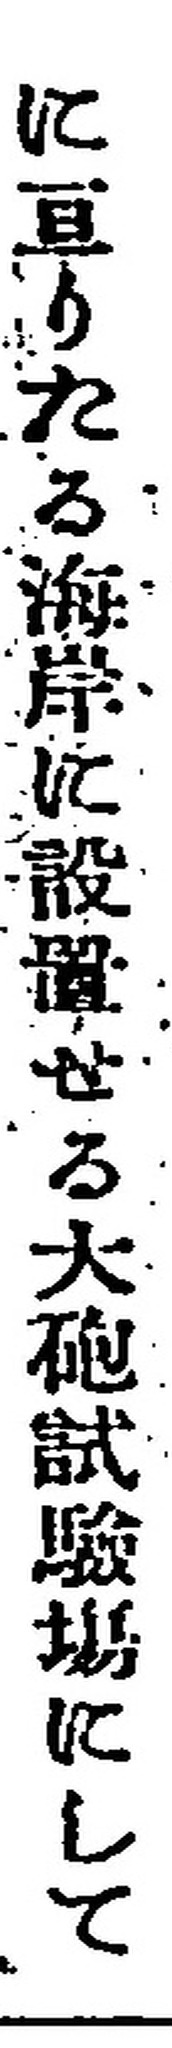に亘りたる海岸に設置せる大砲試験場にして
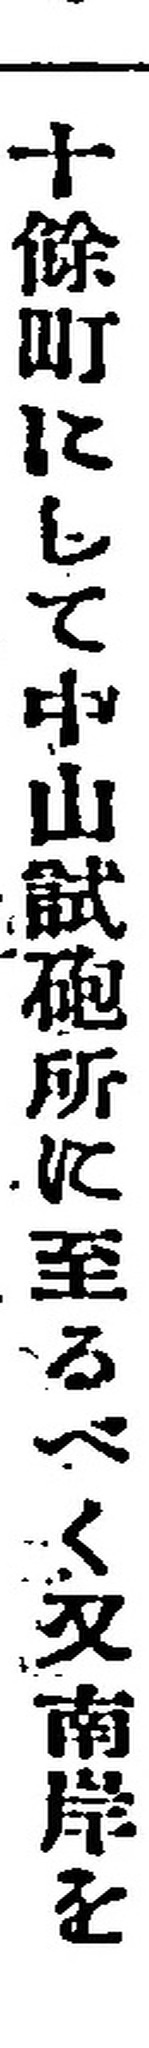十余町にして中山試砲所に至るべく又南岸を
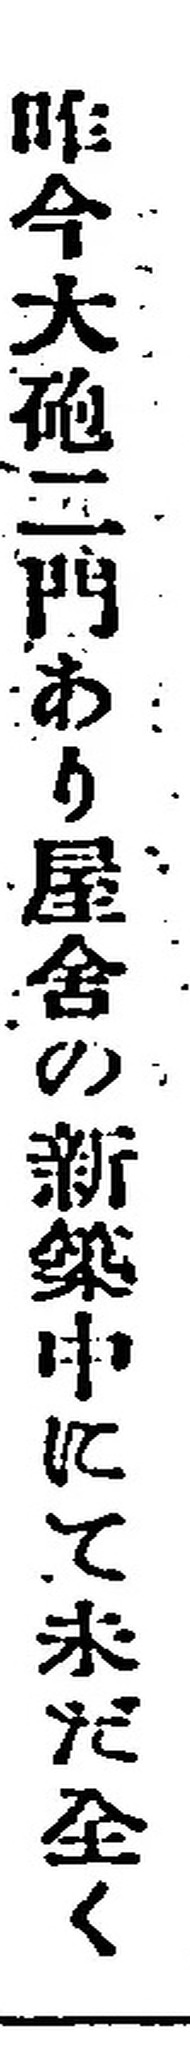昨今大砲二門あり屋舎の新築中にて未だ全く
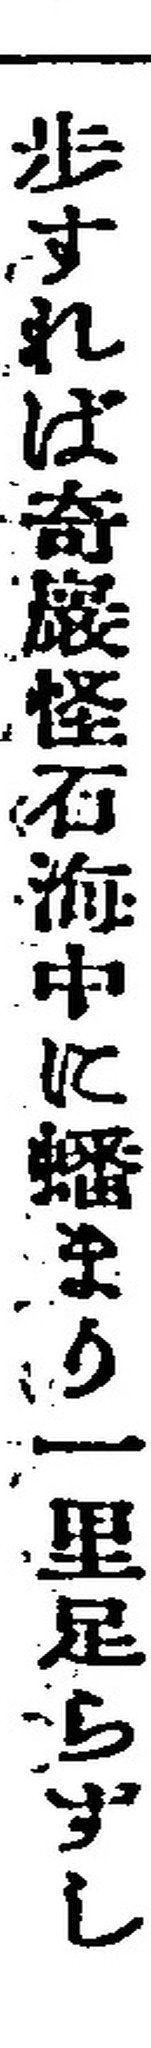歩すれば奇巌怪石海中に蟠まり一里足らずし
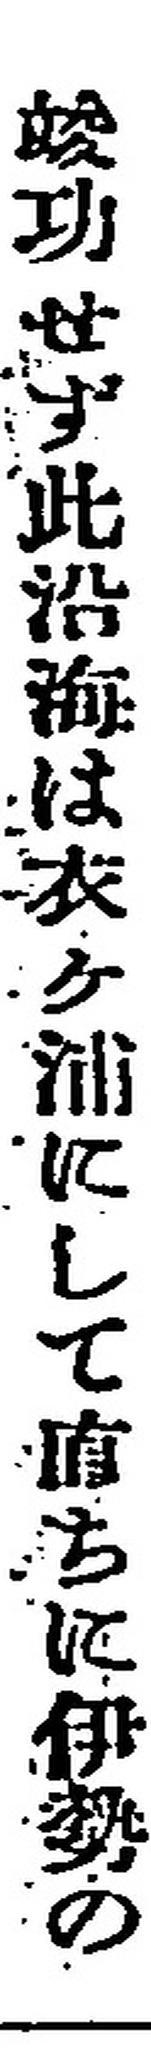竣功せず此沿海は衣ヶ浦にして直ちに伊勢の
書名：東参名勝案内
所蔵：国立国会図書館 National Diet Library, JAPAN
